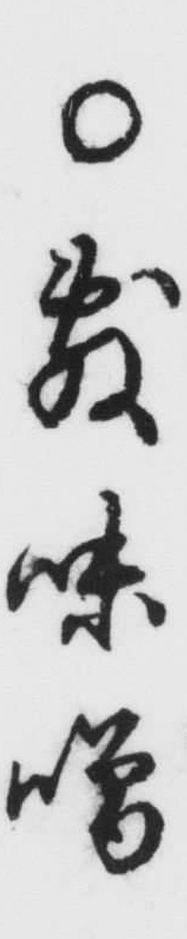○敷味噌
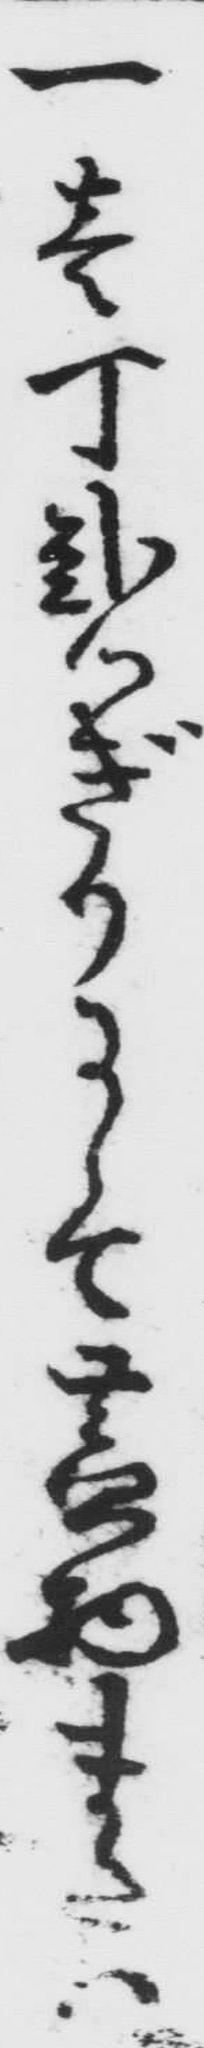一壱丁弐つぎりにして蓋物または
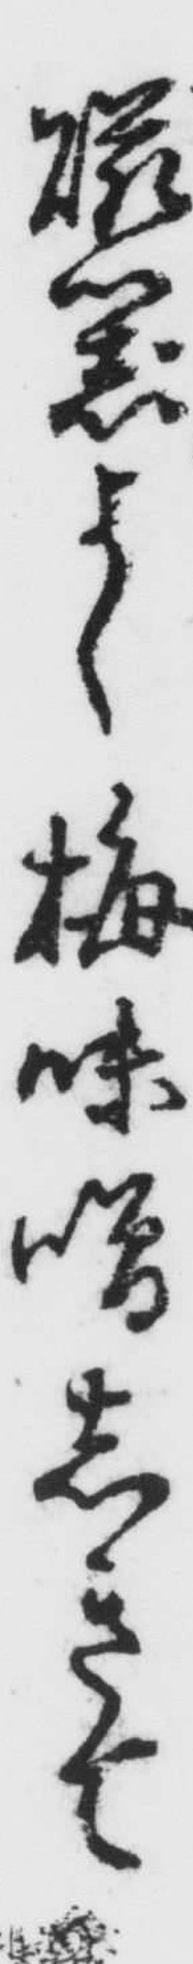磁器よし梅味噌しきて
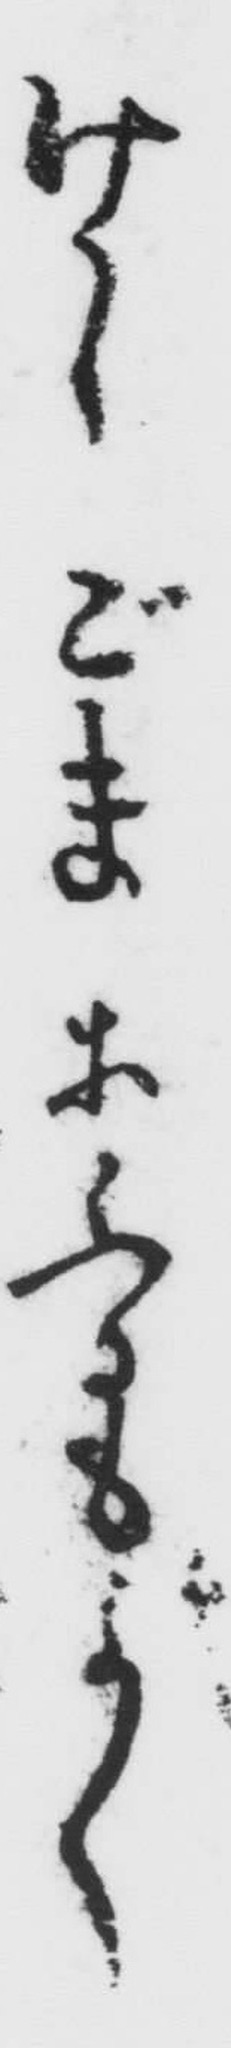けしごま等ふるもよし

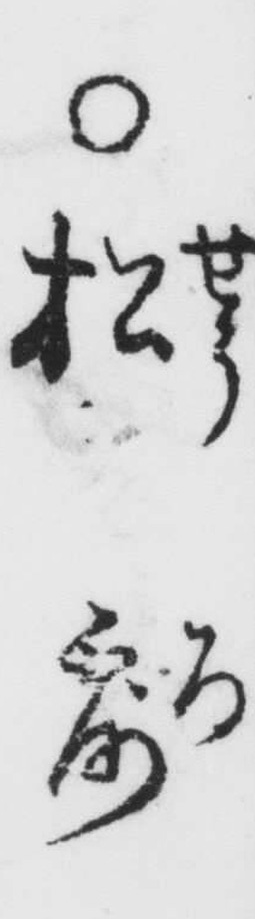○松露
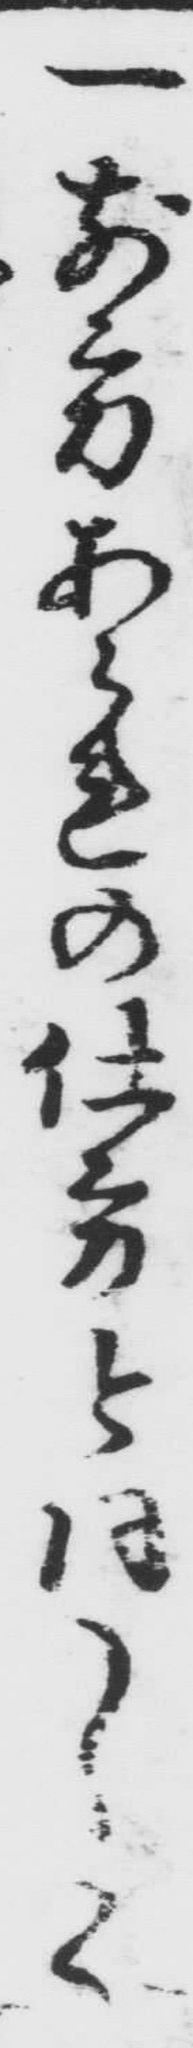一前方あられの仕方と同しく
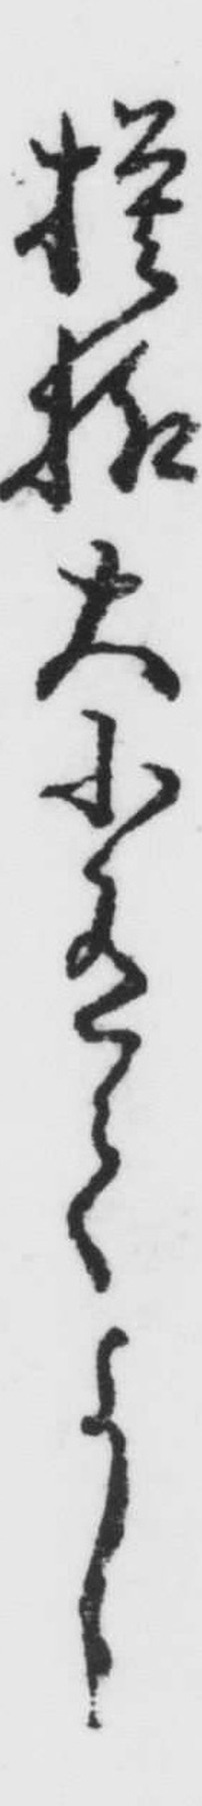模様大小有之よし
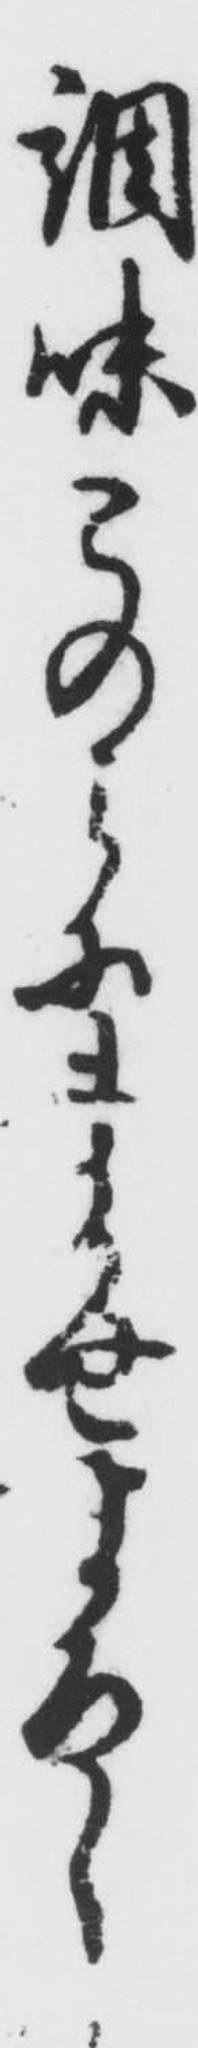調味このみにまかせよろし
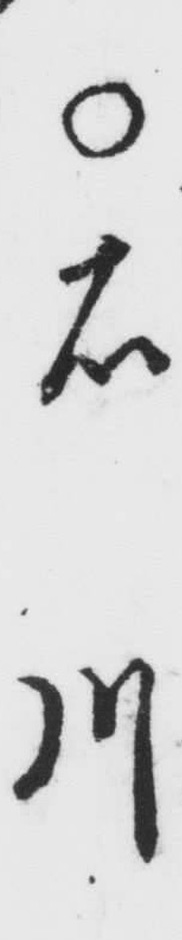○石川
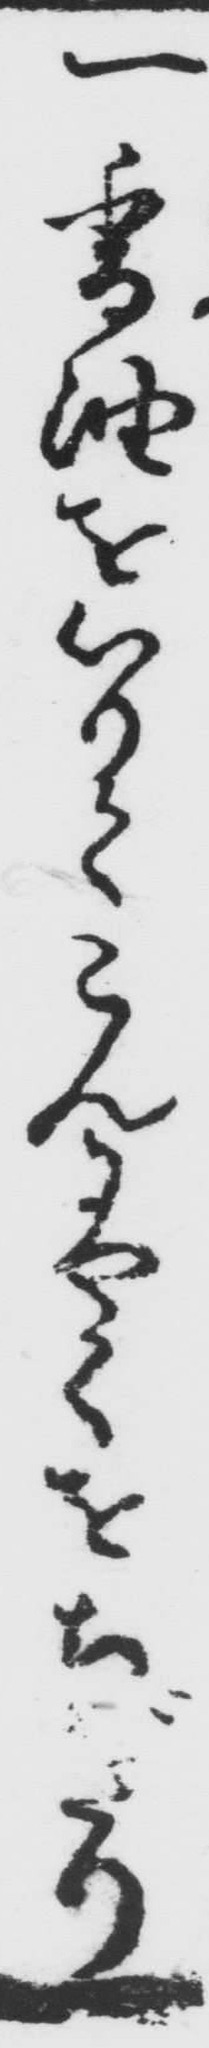一香油をいりてこんにやくをちぎり
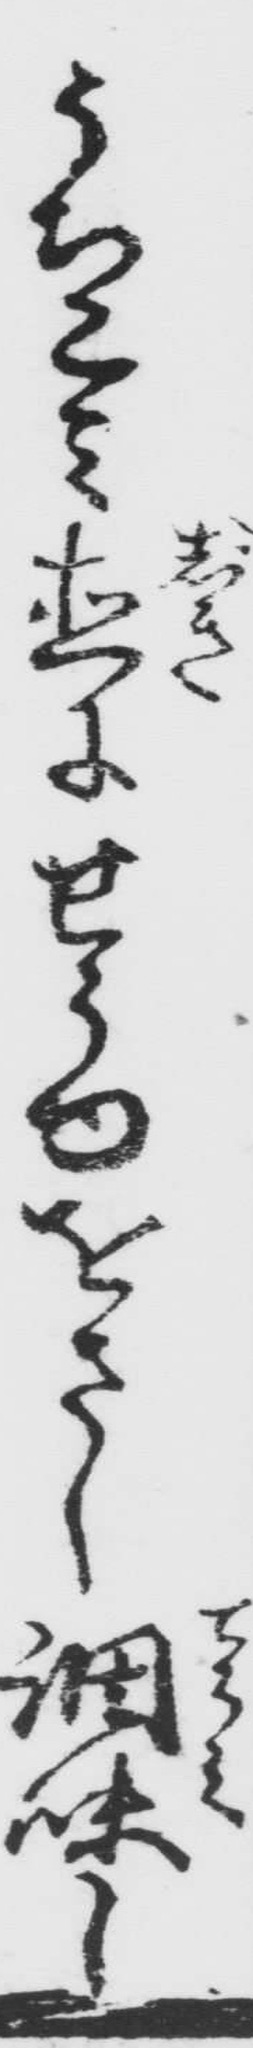うちこみ直にせうゆをさし調味し
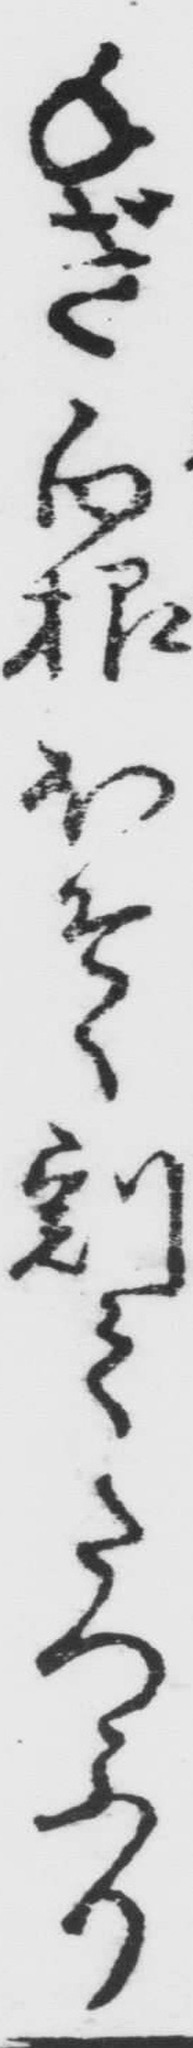ねぎ白根ほそく割てたつふり
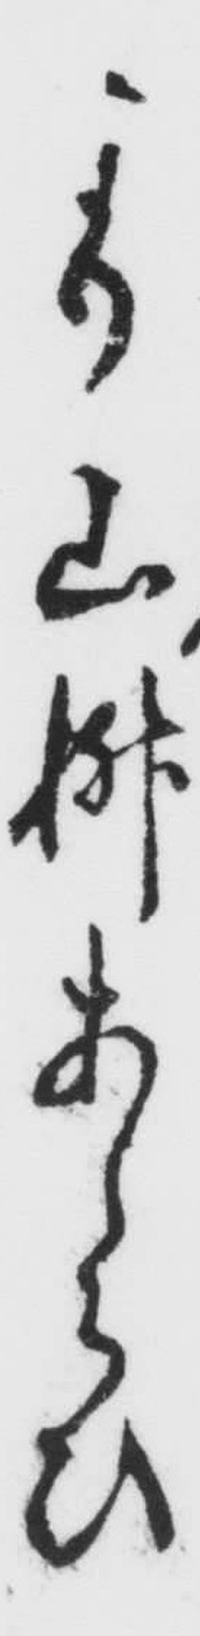より山枡あしらひ
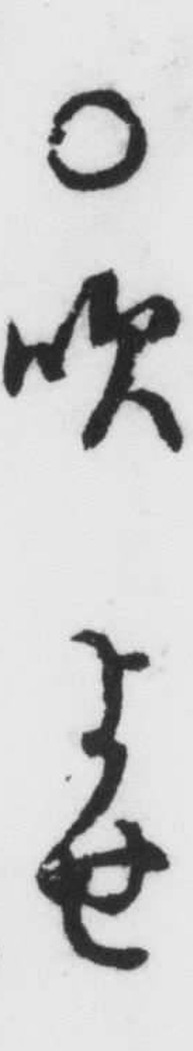○吹よせ
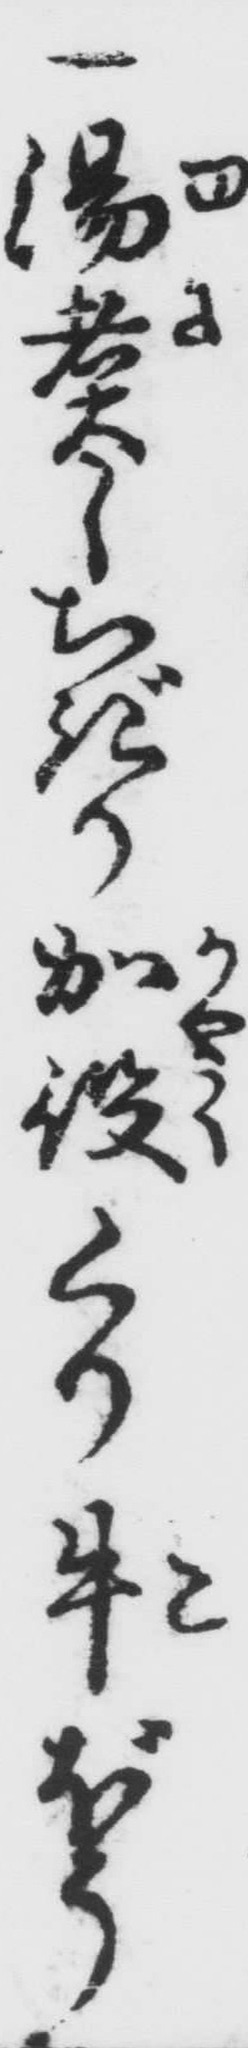一湯煮しちぎり加役くり牛ぼう
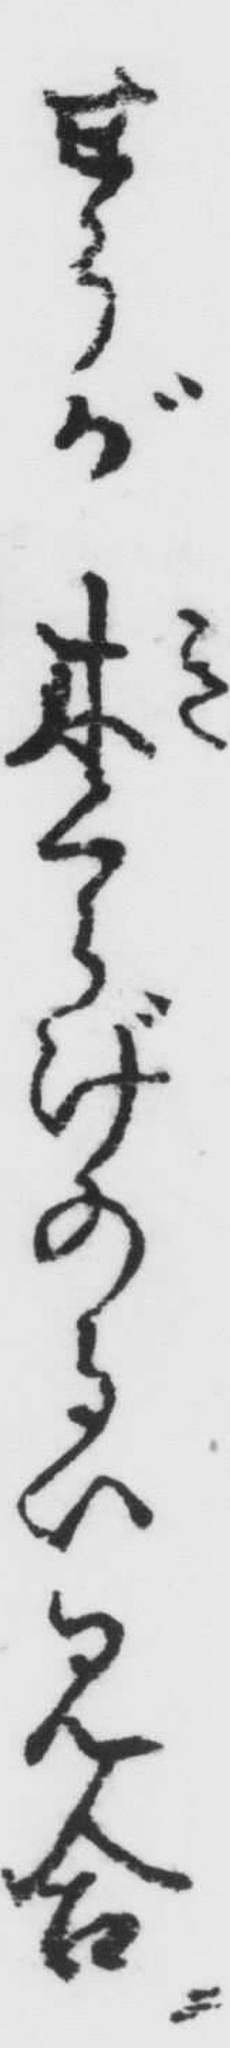せうが木くらげのるい見合
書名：蒟蒻百珍
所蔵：大阪府立大学学術情報センター 国文学研究資料館
